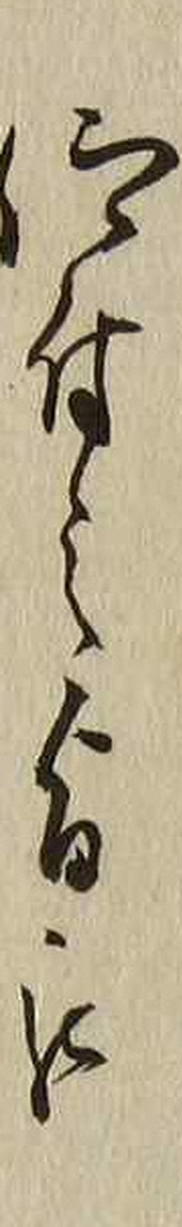仰付之旨被仰出候事
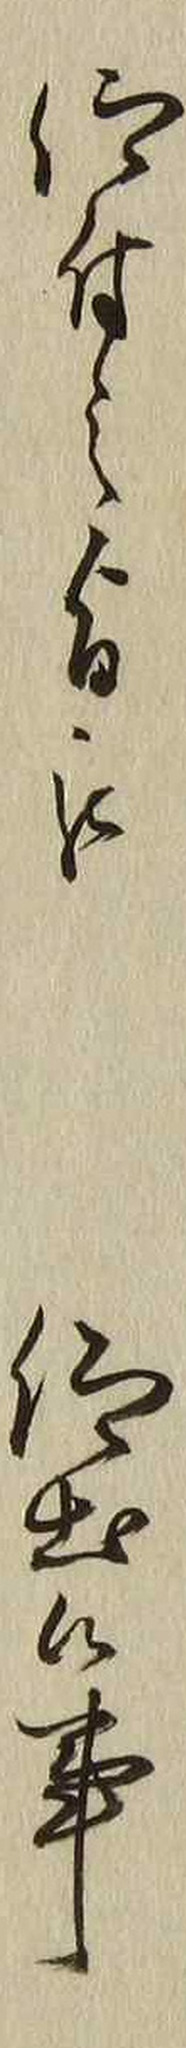仰付之旨被仰出候事
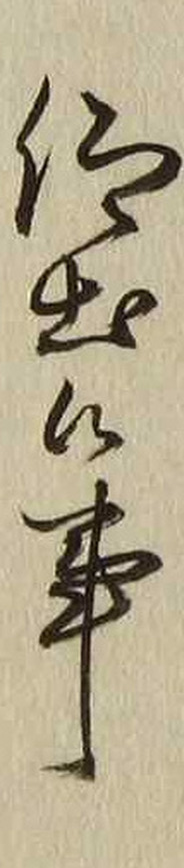仰付候事
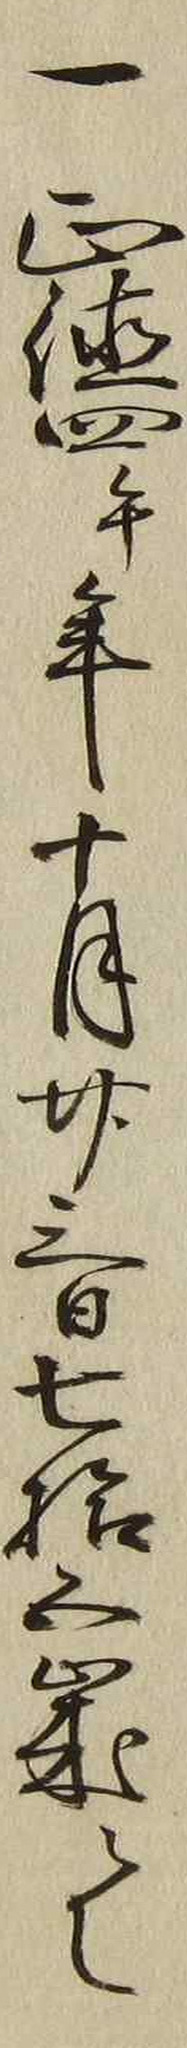一正徳四午年十月廿三日七拾五歳ニて
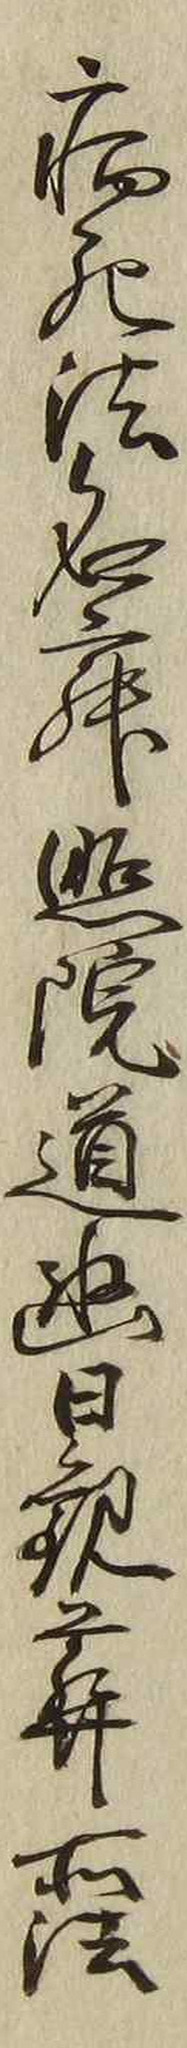病死法名舞照院道幽日観葬所法
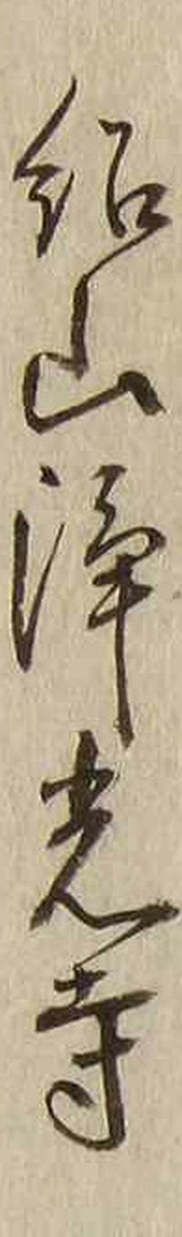紹山浄光寺

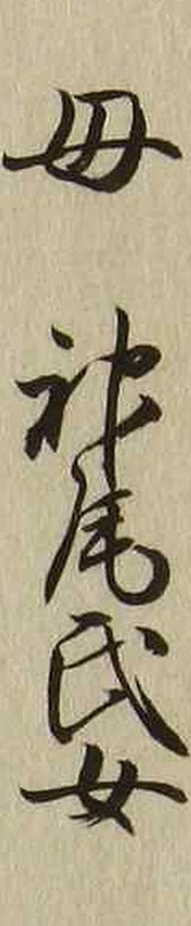母神尾氏女
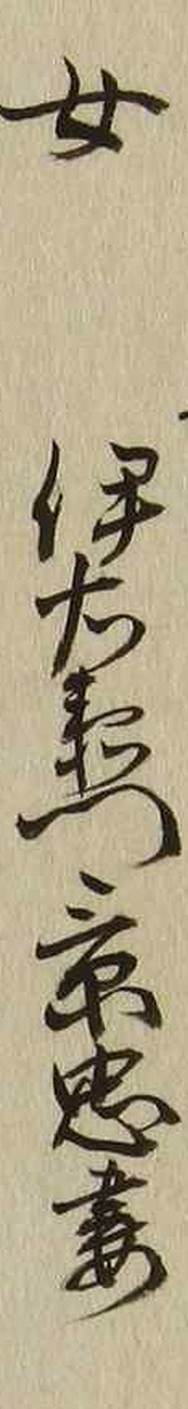女伊右衛門景忠妻
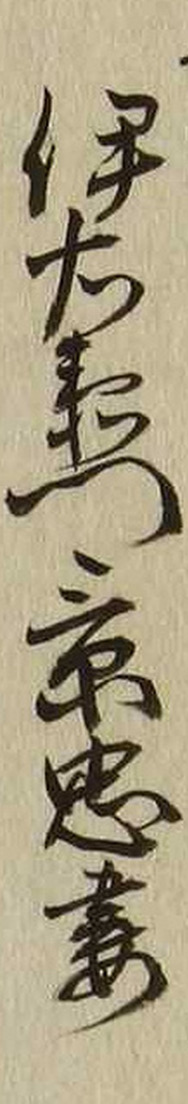女伊右衛門景忠妻
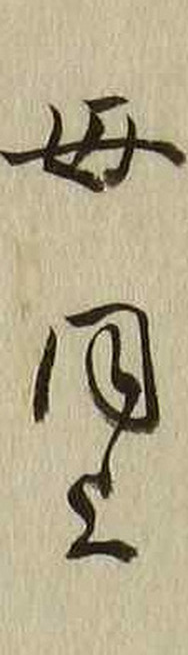母同上
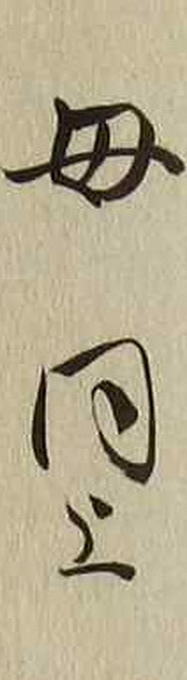母同上
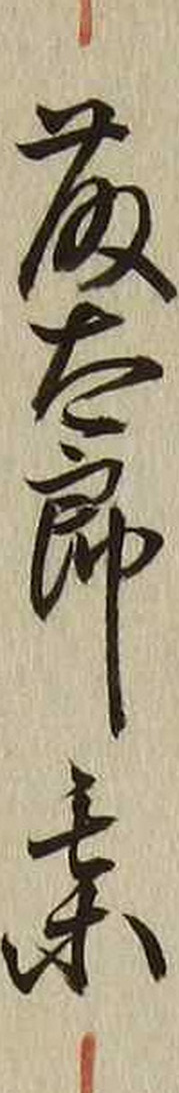藤太郎某
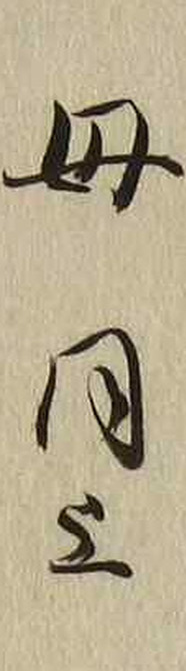母同上
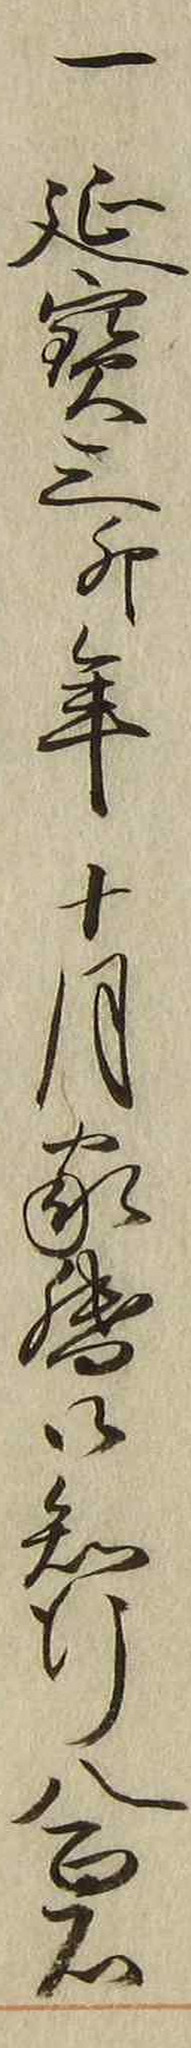一延宝三卯年十月家督御知行八百石
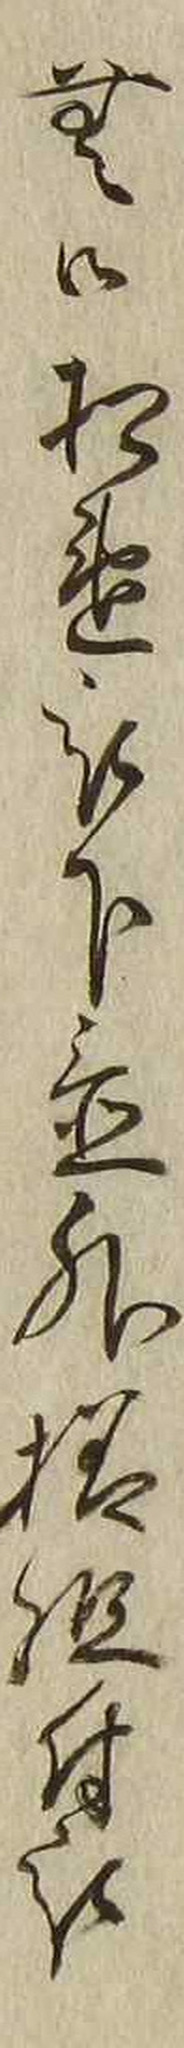無御相違被下置外様組付被
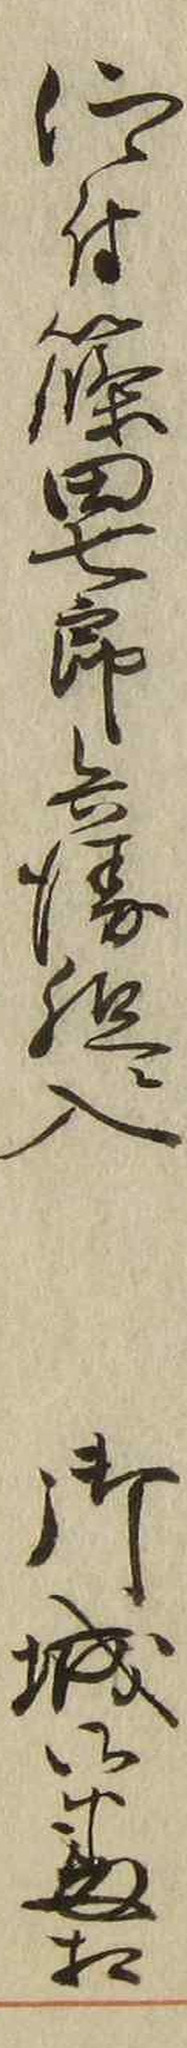仰付篠田七郎兵衛組ニ入御城御番相
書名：諸士系譜　巻之60　と之部3
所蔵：会津若松市立会津図書館
